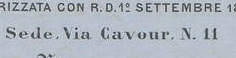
Sede, Via Cavour, N. 11
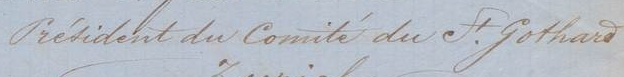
Président du Comité du St Gothard
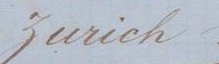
Zurich.
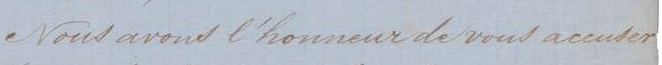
Nous avons l'honneur de vous accuser
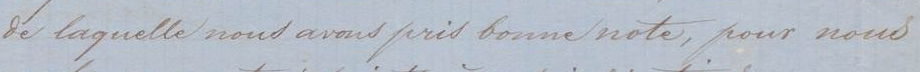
de laquelle nous avons pris bonne note, pour nous
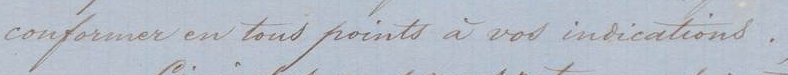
conformer en tous points à vos indications.
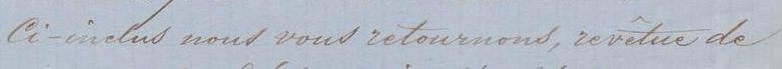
Ci-inclus nous vous retournons, revêtue de
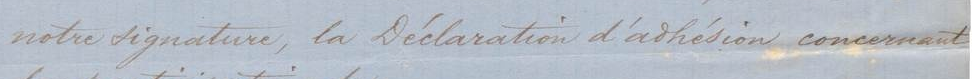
notre signature, la Déclaration d'adhésion concernant
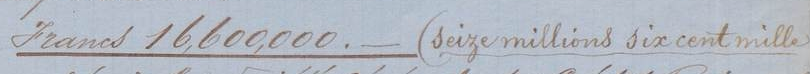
Francs 16,000,000.– (seize millions six cent mille
